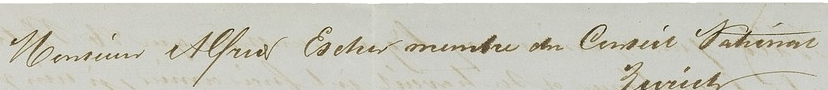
Monsieur Alfred Escher membre du Conseil National
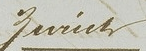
Zurich
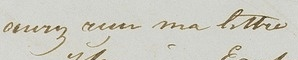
aurez reçu ma lettre. –
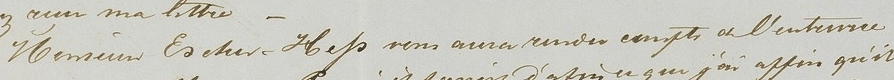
Monsieur Escher-Hess vous aura rendu compte de l'entrevue
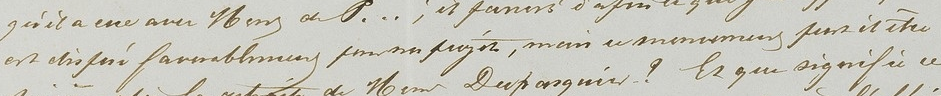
est disposé favorablement pour nos projets, mais ce mouvement peut il être
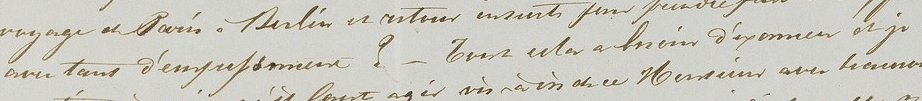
avec tout d'empressement? Tout cela a besoin d'examen et je
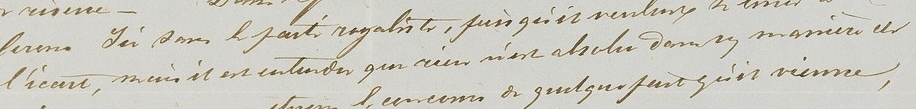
l'écart, mais il est entendu que rien n'est absolu dans notre manière de
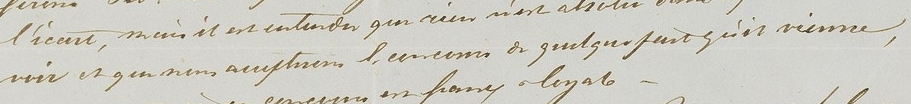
voir et que nous accepterons le concours de quelque part qu'il vienne,
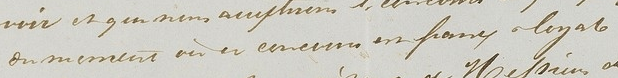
du moment où ce concours est franc et loyal.
